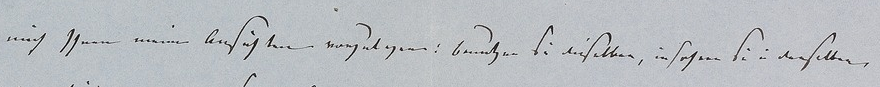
mich Ihnen meine Ansichten vorzulegen: benutzen Sie dieselben, insofern Sie in denselben
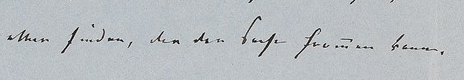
etwas finden, das der Sache frommen kann.
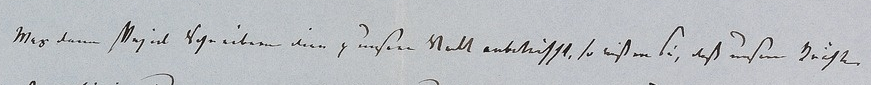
Was dann Spezial Schreibern dies & unsere Stadt anbetrifft, so wißen Sie, daß unsere Kräfte
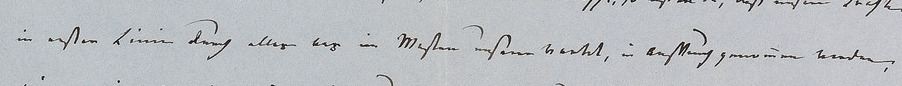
in erster Linie durch alles was im Westen unserer wartet, in Anspruch genommen werden;
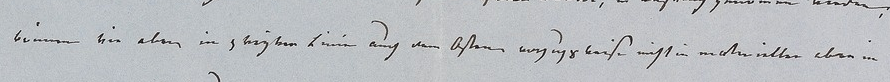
können wir aber in zweyter Linie auch dem Osten vorzugsweise nicht in materieller aber in
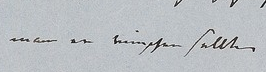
man es wünschen sollte.
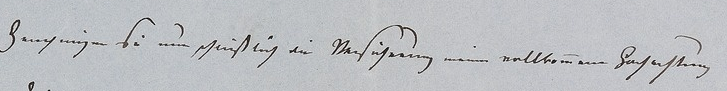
Genehmigen Sie nun schließlich die Versicherung meiner vollkommenen Hochachtung
